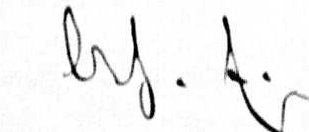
Ah E
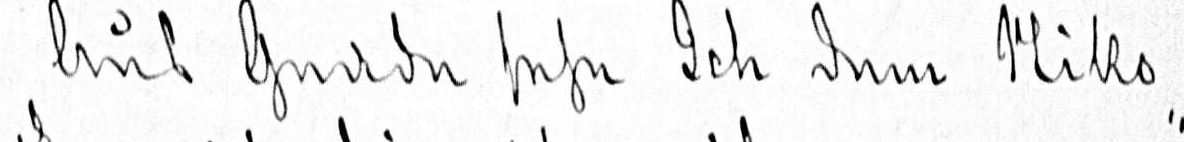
Aus Gnade sehe ich dem Niko¬
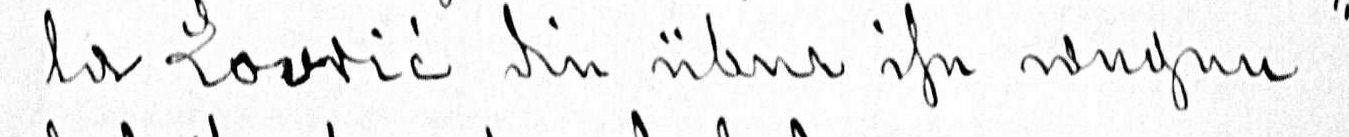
la Lovrić die über ihn wegen
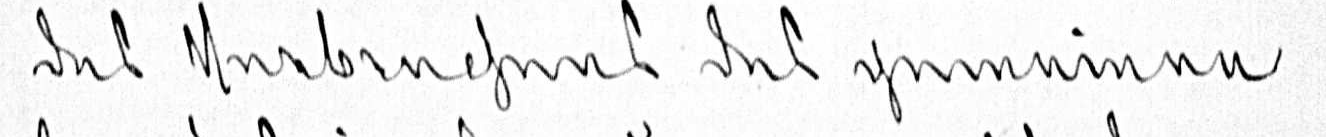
des Verbrechens des gemeinen
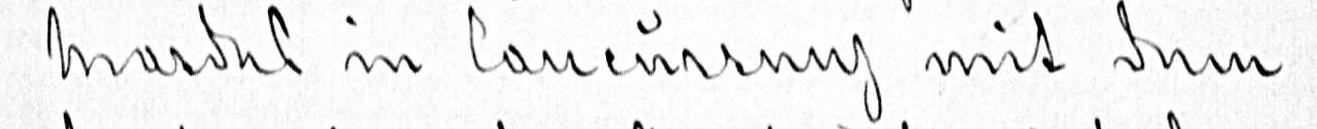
Mordes in Concurrenz mit dem
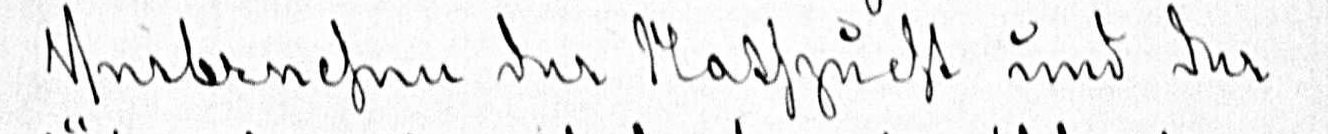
Verbrechen der Nothzucht und der
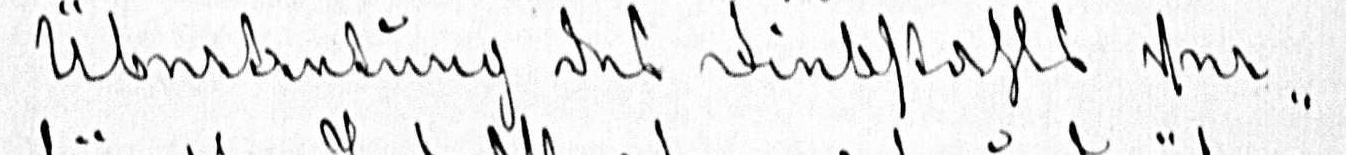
Übertretung des Diebstahls ver¬
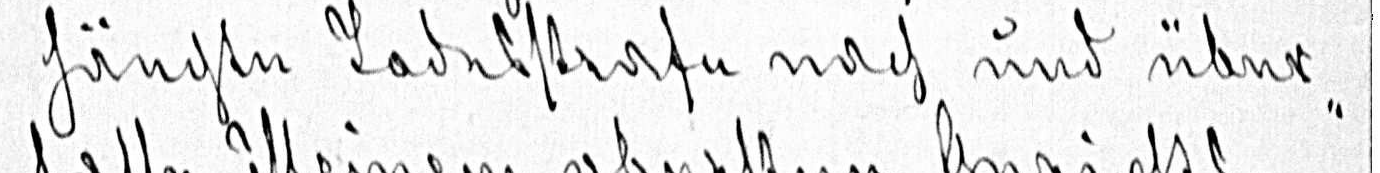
hängte Todesstrafe nach, und über¬
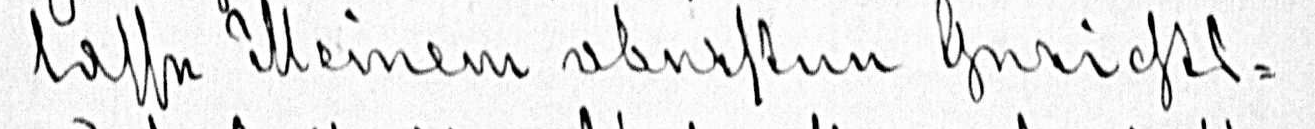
lasse Meinem obersten Gerichts-
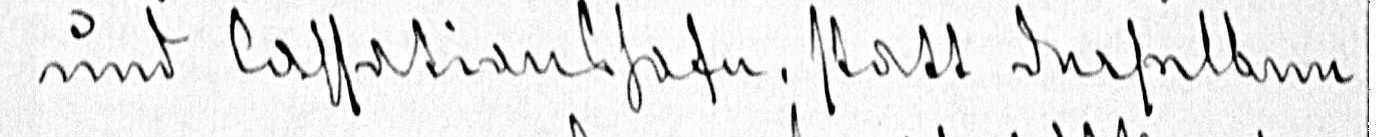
und Cassationshofe, statt derselben
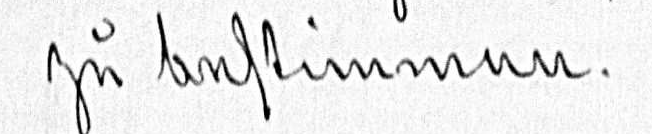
zu bestimmen.
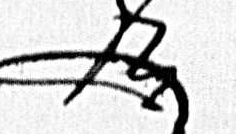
FJ
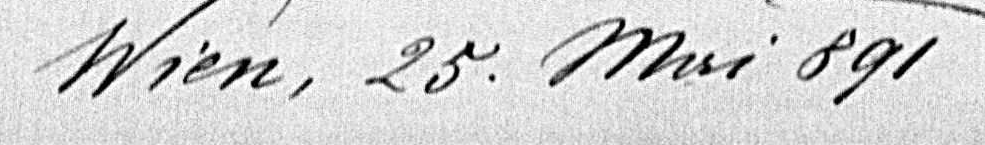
Wien, 25. Mai 1891
